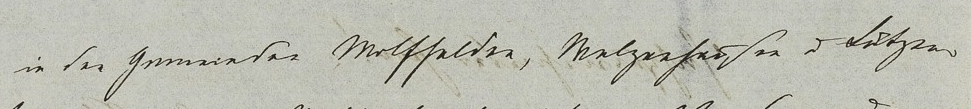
in den Gemeinden Wolfhalden, Walzenhausen & Lutzen-
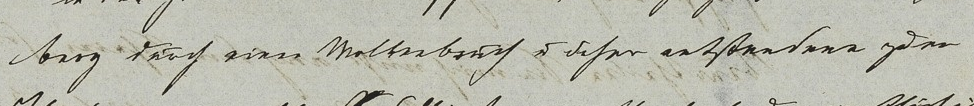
berg durch einen Wolkenbruch & daher entstandene zum
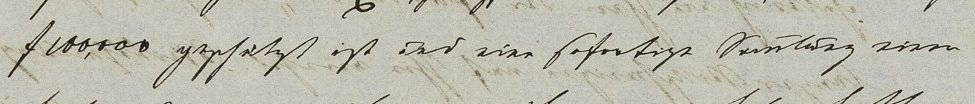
f 100,000 geschätzt ist und eine sofortige Sammlung einer
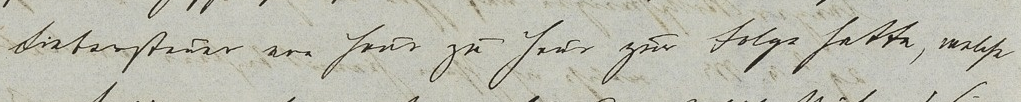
Liebessteuer von Haus zu Haus zur Folge hatte, welche
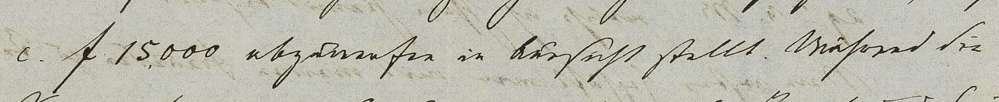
c. f 15,000 abzuwerfen in Aussicht stellt. Während die
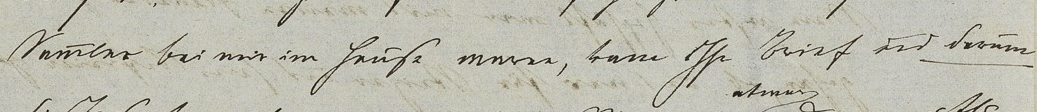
Sammler bei mir im Hause waren, kam Ihr Brief und darum
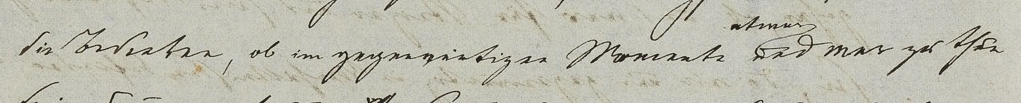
die Bedenken, ob im gegenwärtigen Momente etwas und was zu thun
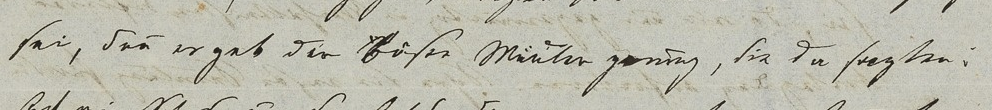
sei, denn es gab der bösen Mäuler genug, die da fragten:
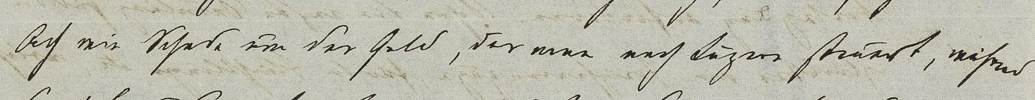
Ach wie Schade um das Geld, das man nach Luzern steuert, während
